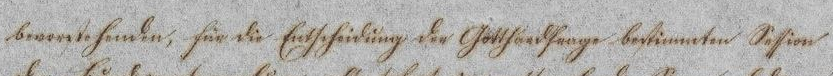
bevorstehenden, für die Entscheidung der Gotthardfrage bestimmten Session
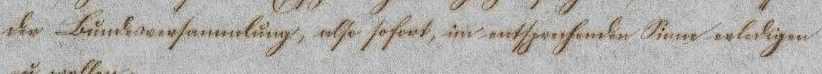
der Bundesversammlung, also sofort, im entsprechenden Sinne erledigen
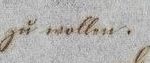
zu wollen.
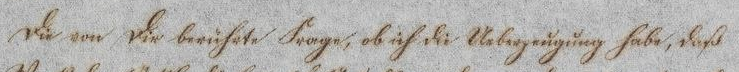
Die von Dir berührte Frage, ob ich die Ueberzeugung habe, daß
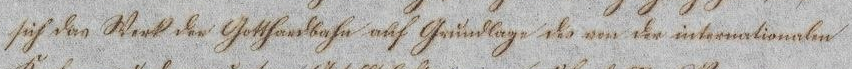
sich das Werk der Gotthardbahn auf Grundlage des von der internationalen
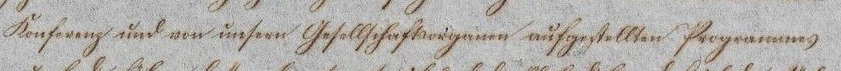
Konferenz und von unsern Gesellschaftsorganen aufgestellten Programmes
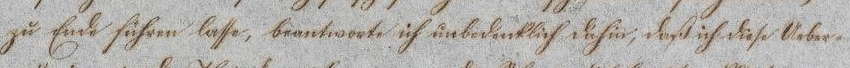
zu Ende führen lasse, beantworte ich unbedenklich dahin, daß ich diese Ueber-
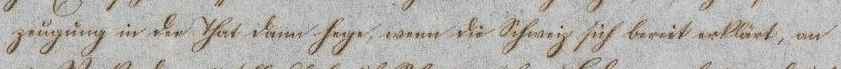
zeugung in der That dann hege, wenn die Schweiz sich bereit erklärt, an
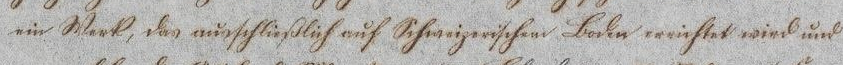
ein Werk, das ausschließlich auf Schweizerischem Boden errichtet wird und
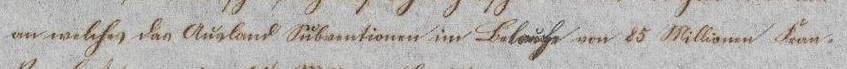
an welches das Ausland Subventionen im Belaufe von 85 Millionen Fran-
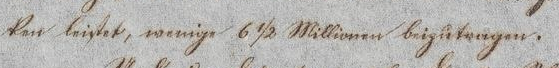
ken leistet, wenige 6½ Millionen beizutragen.
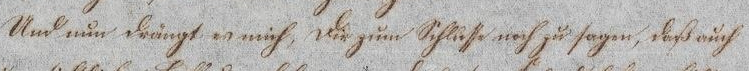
Und nun drängt es mich, Dir zum Schlusse noch zu sagen, daß auch
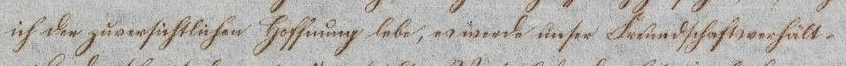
ich der zuversichtlichen Hoffnung lebe, es werde unser Freundschaftsverhält-
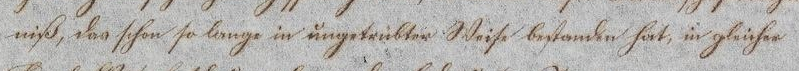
niß, das schon so lange in ungetrübter Weise bestanden hat, in gleicher
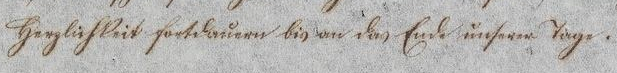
Herzlichkeit fortdauern bis an das Ende unserer Tage.
